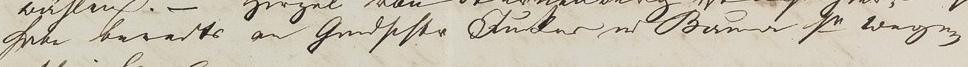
habe bereits an Gmdschbr Jucker v. Bauma sn wegen
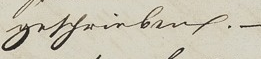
geschrieben. –
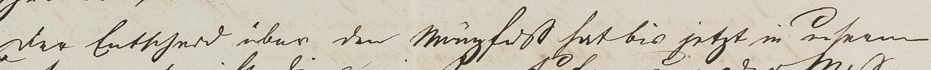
Der Entscheid über den Münzfuß hat bis jetzt in unserm
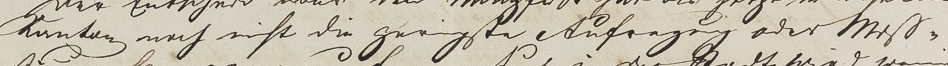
Kanton noch nicht die geringste Aufregung oder Miß-
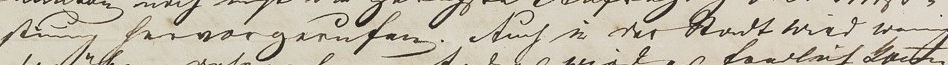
stimmung hervorgerufen. Auch in der Stadt wird wenig
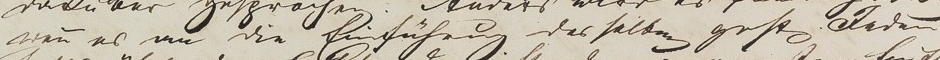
wenn es an die Einführung des selben geht. Jeden-
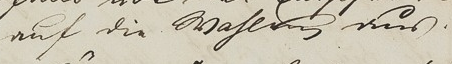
auf die Wahlen aus. –
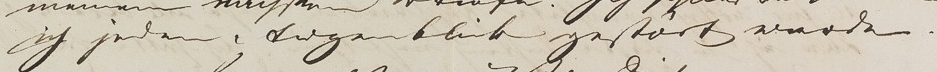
ich jeden Augenblick gestört werde.
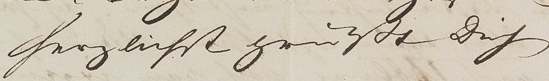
Herzlichst grüßt Dich
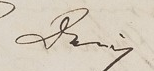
Dein
